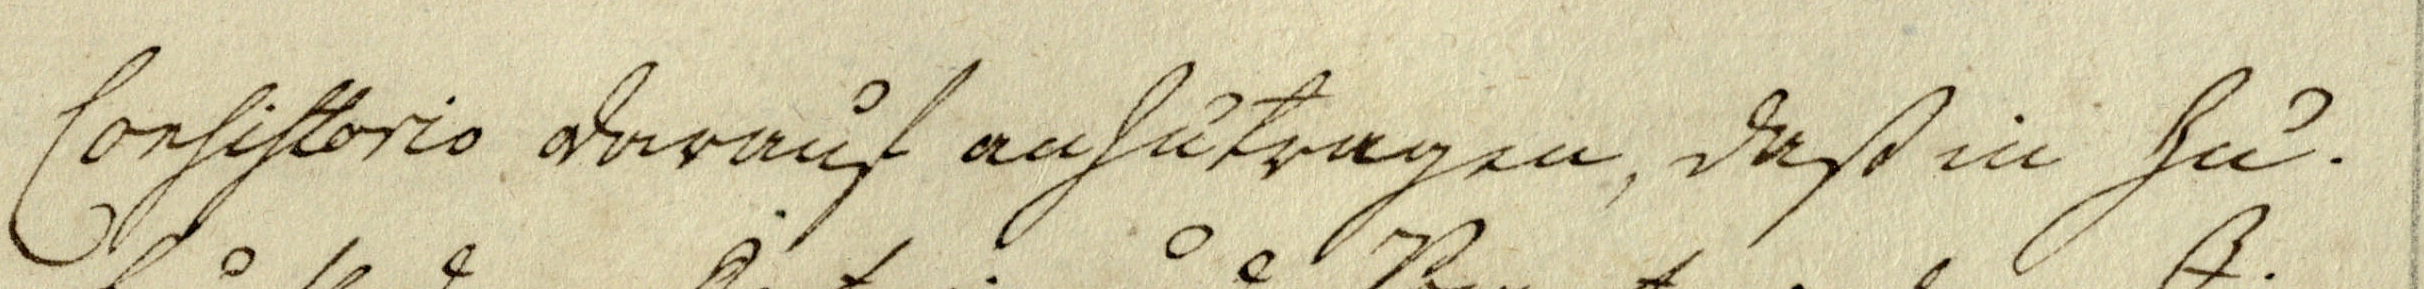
Consistorio darauf anzutragen, daß in Zu¬
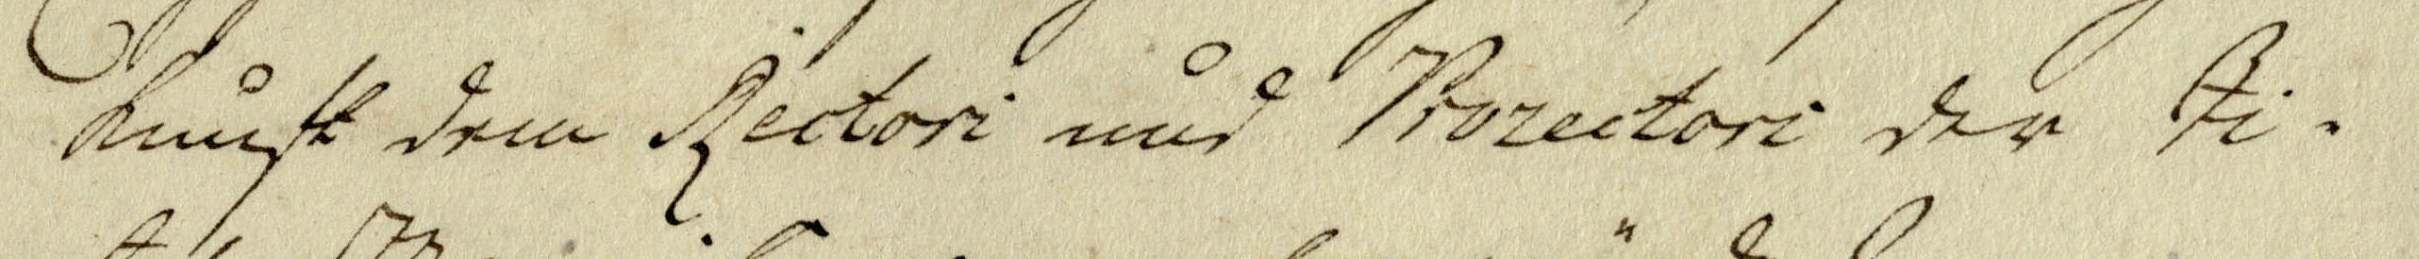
kunft dem Rectori und Porectori der Ti¬
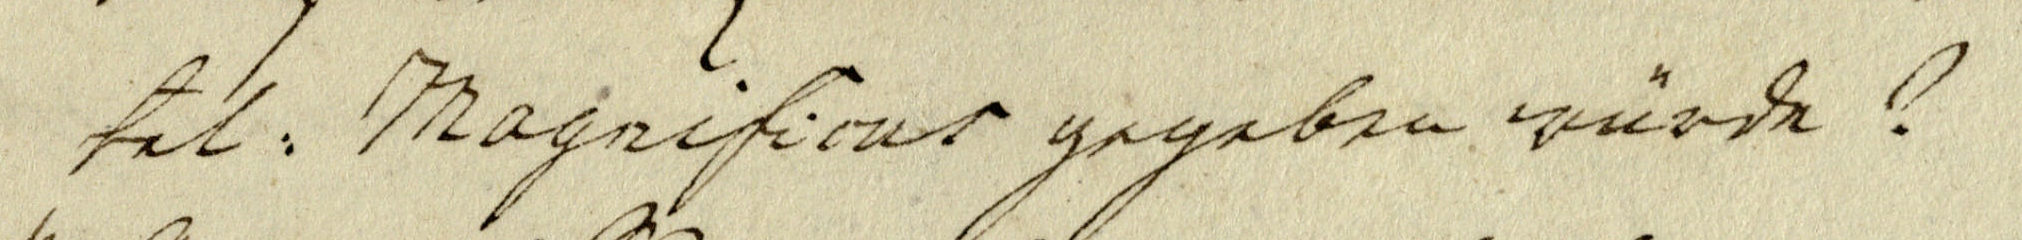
tel: Magnificus gegeben würde ?
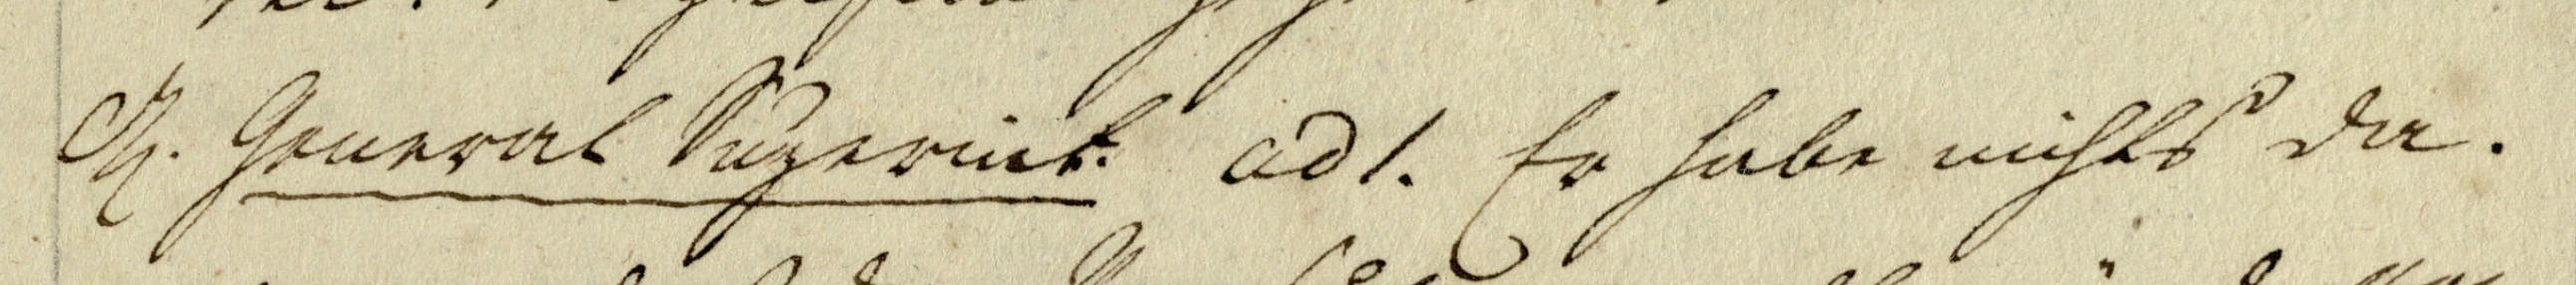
dh. General Superint. ad 1. Er habe nichts da¬
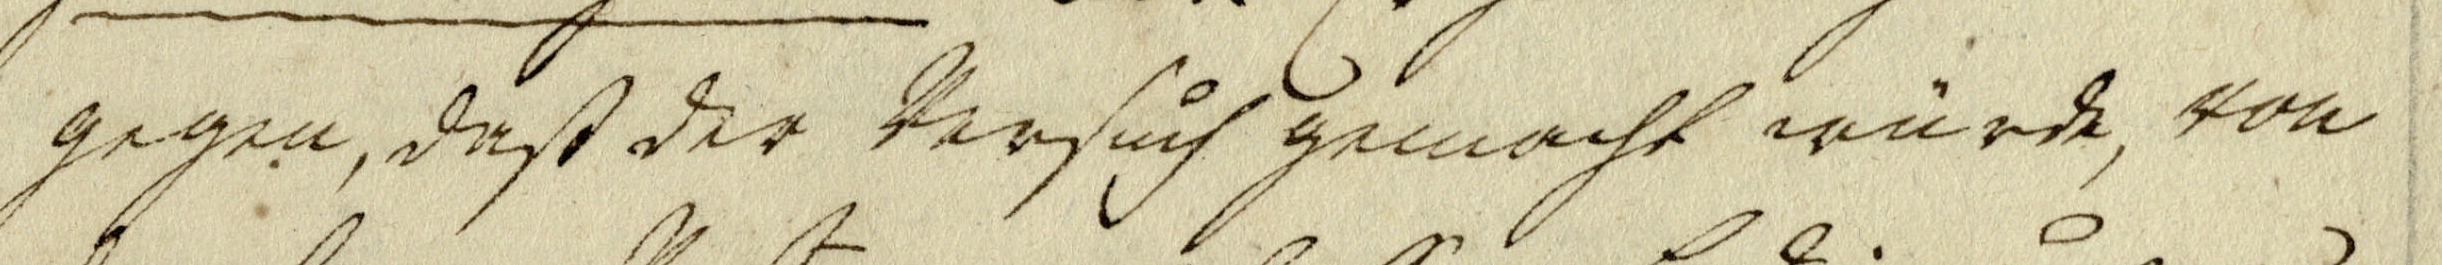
gegen, daß der Versuch gemacht würde, von
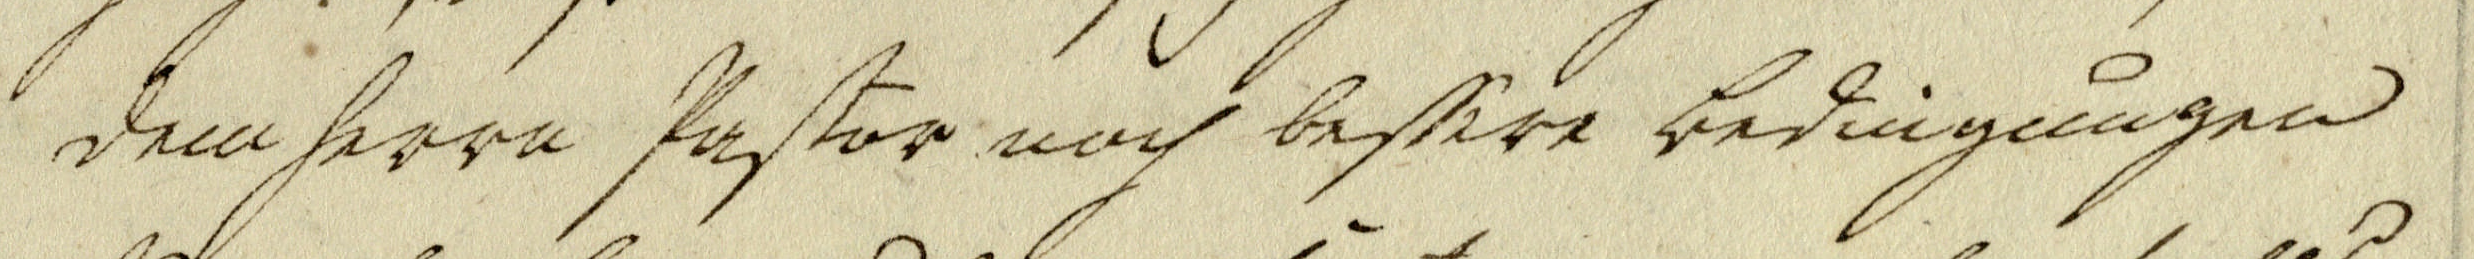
dem Herrn Pastor noch bessere Bedingungen
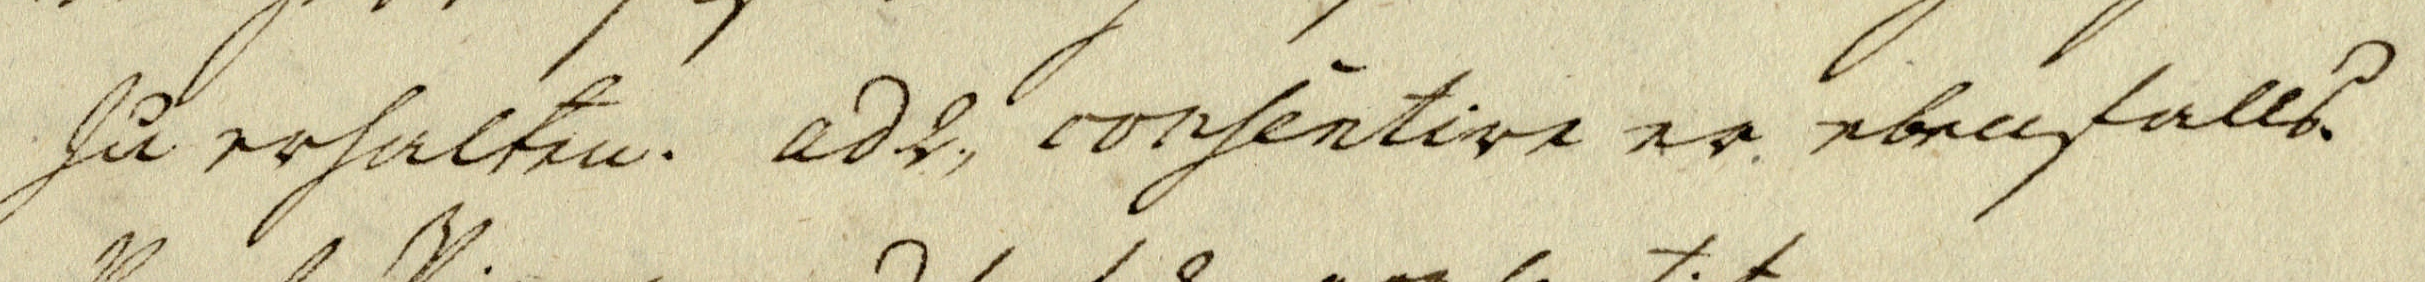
zu erhalten. ad 2., consentire er ebenfalls.
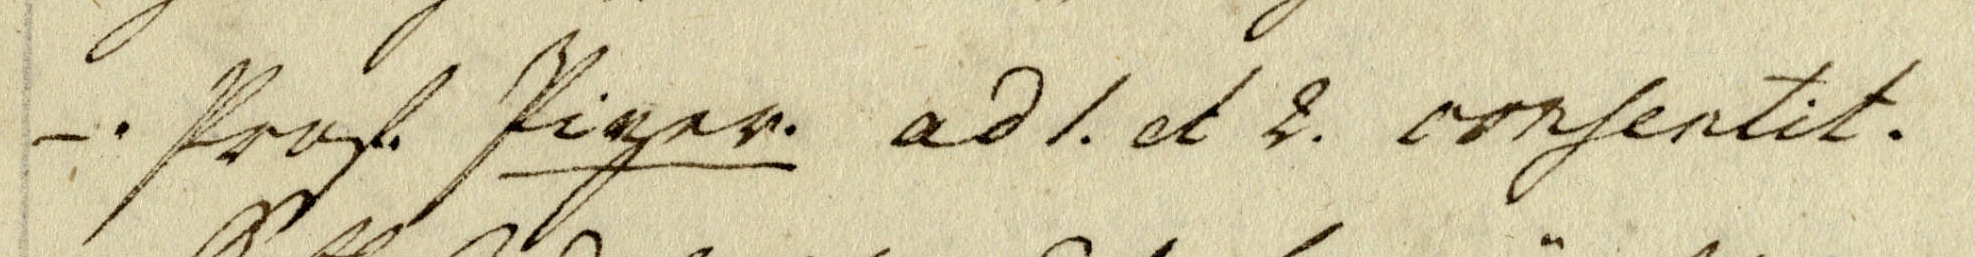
Prof. Piper ad 1. et 2. consentit.
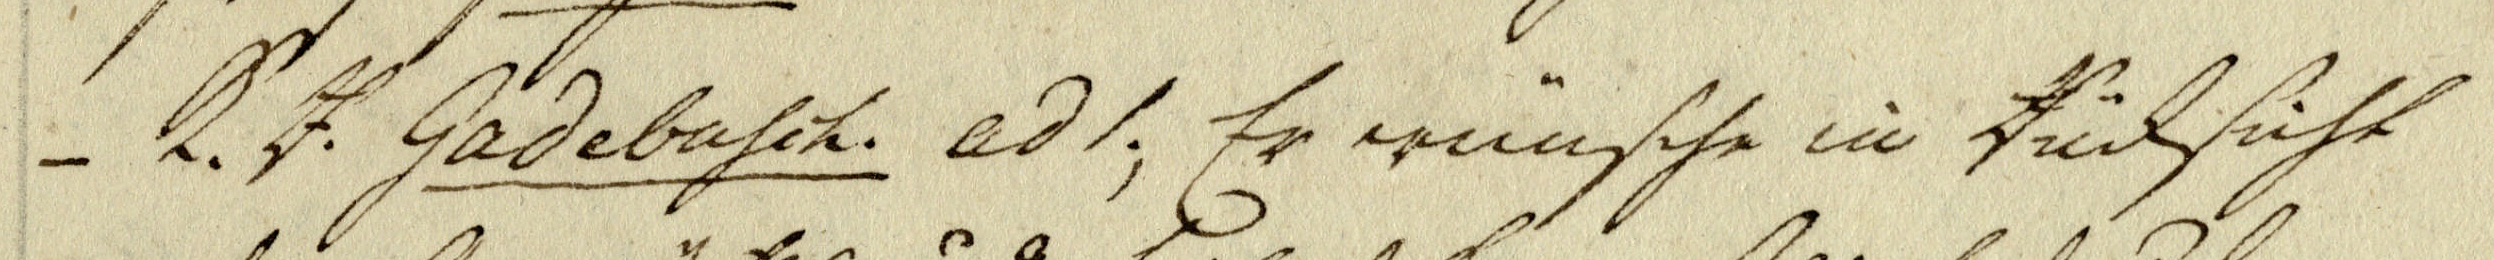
K. R. Gadebusch. ad 1., Er wünsche in Rücksicht
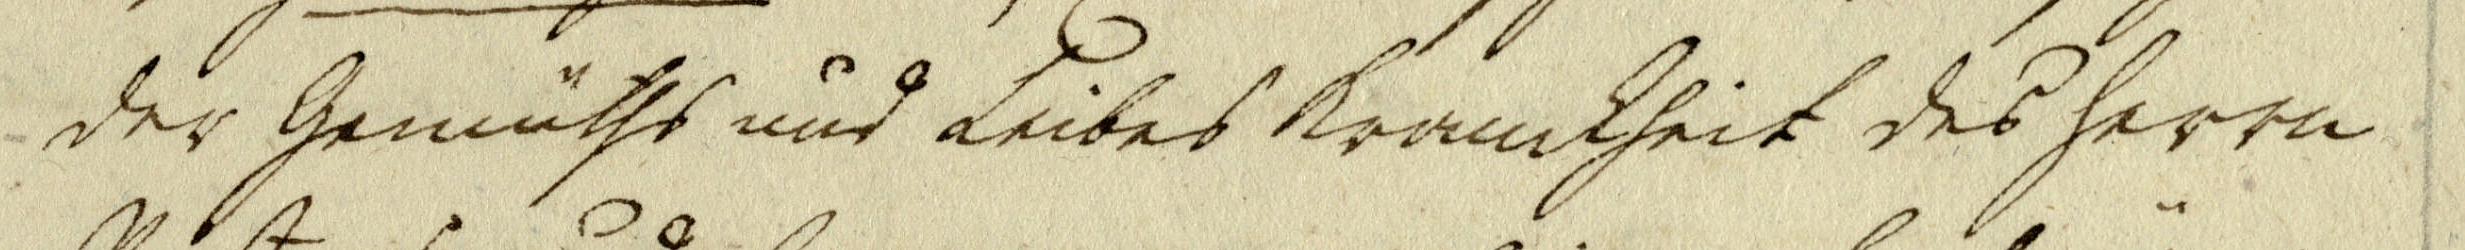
der Gemüths und Leibes Kranckheit des Herrn
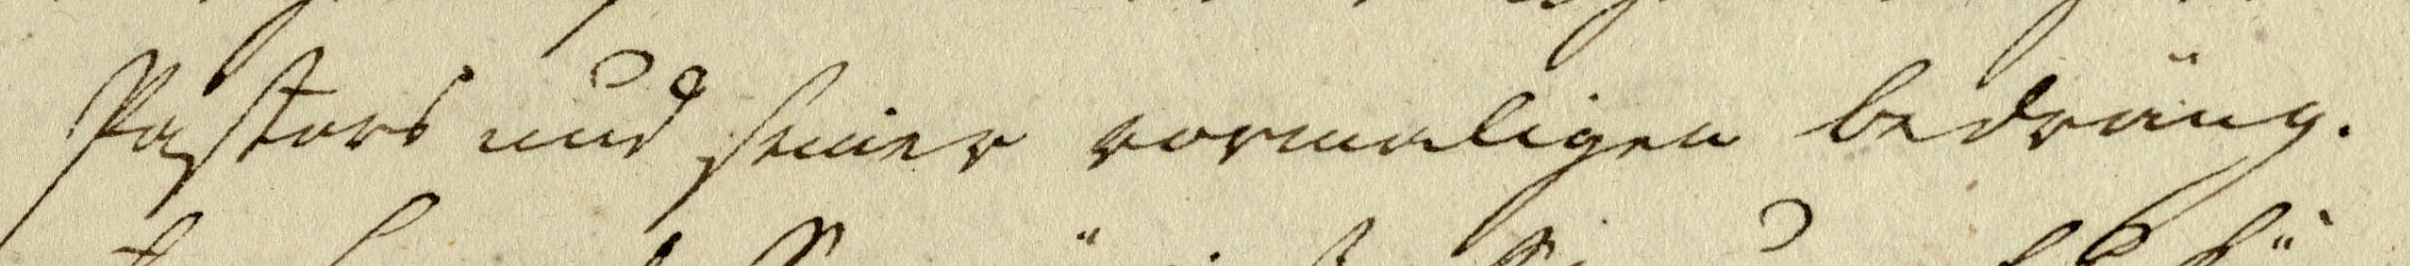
Pastors und seiner vormaligen bedräng¬
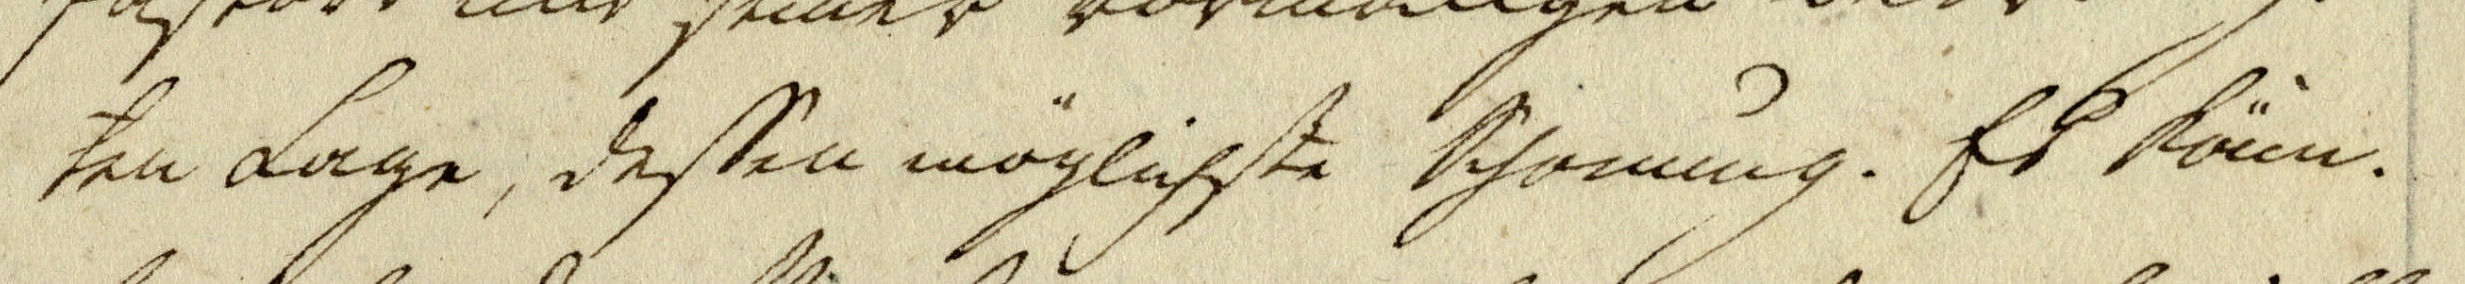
ten Lage, dessen möglichste Schonung. Es könn¬
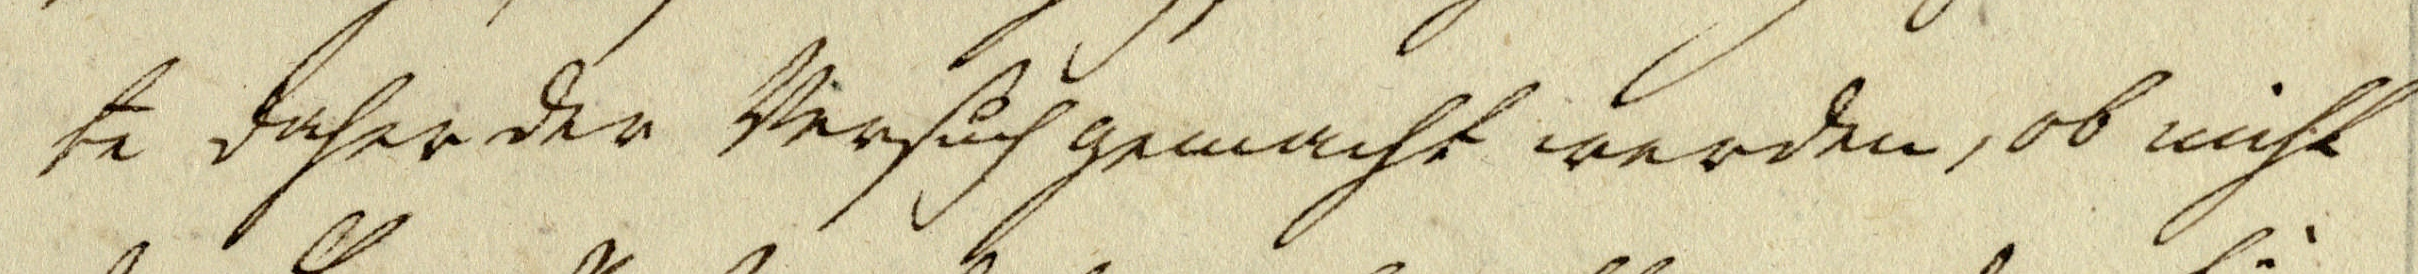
te daher der Versuch gemacht werden, ob nicht
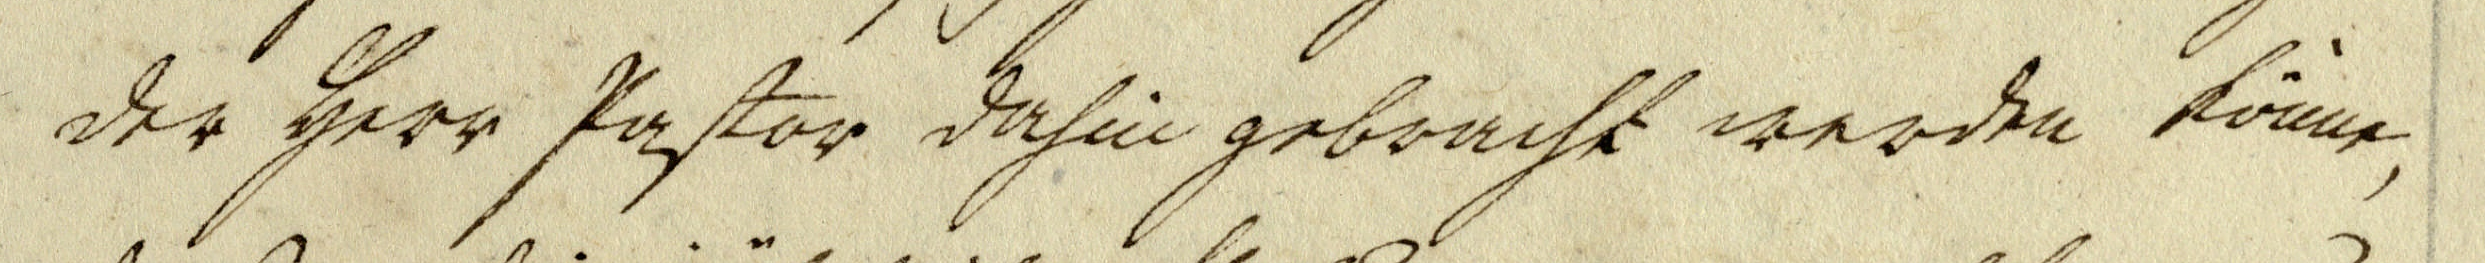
der Herr Pastor dahin gebracht werden könne,
